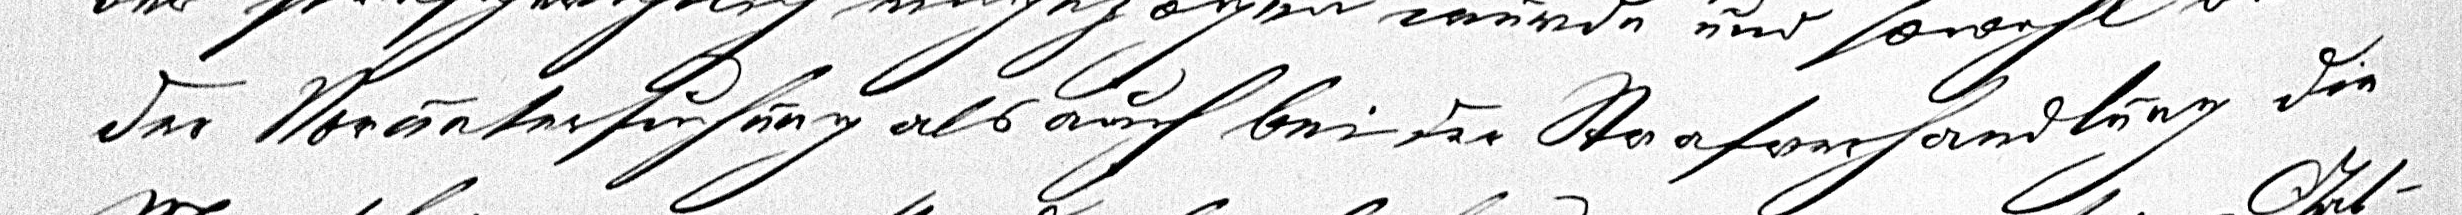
der Voruntersuchung als auch bei der Strafverhandlung die
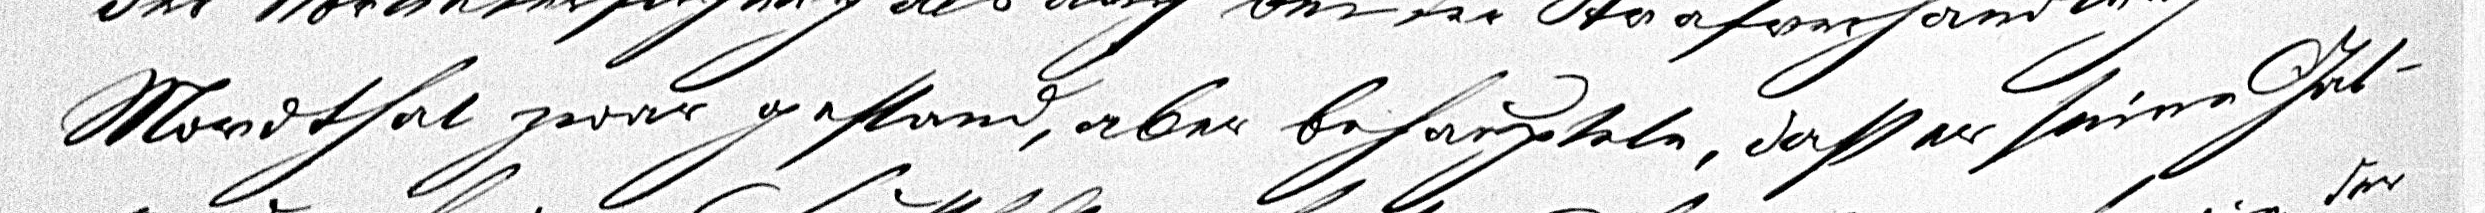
Mordthat zwar gestand, aber bexxtete, daß er seine Gat¬
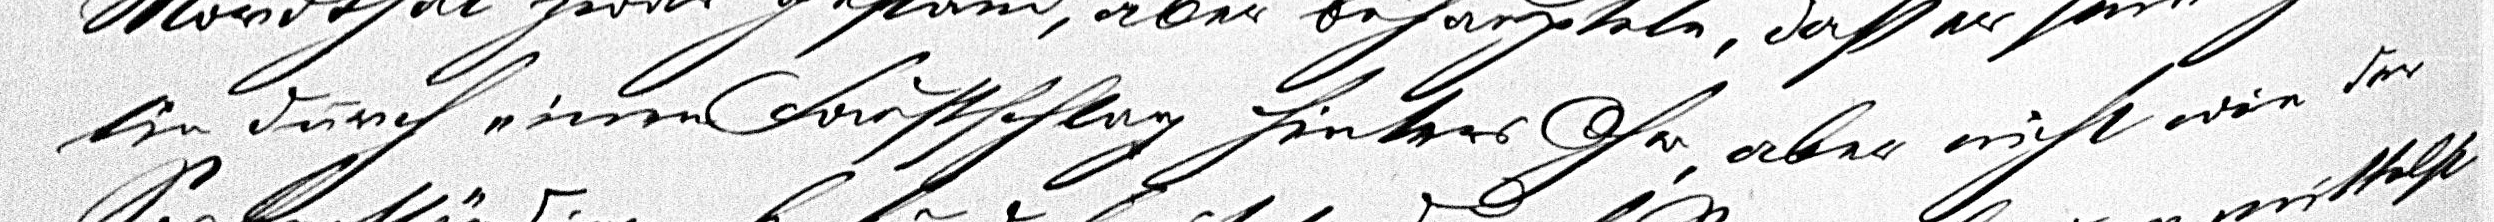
tin durch einen Faustschlag hinters Ohr, aber nicht wie der
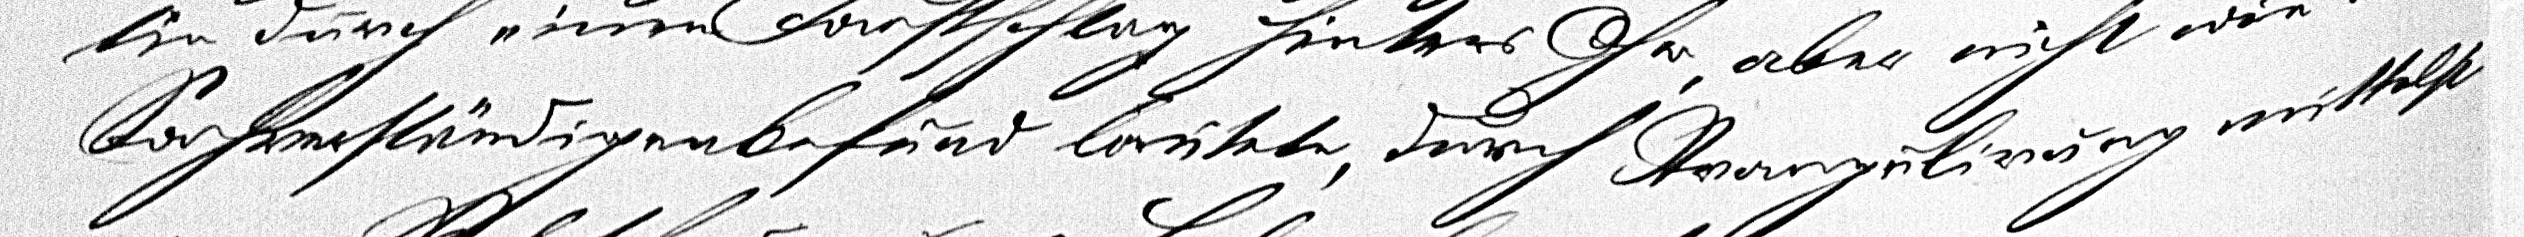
Sachverständigensfund lautete, durch Strangulierung mittelst
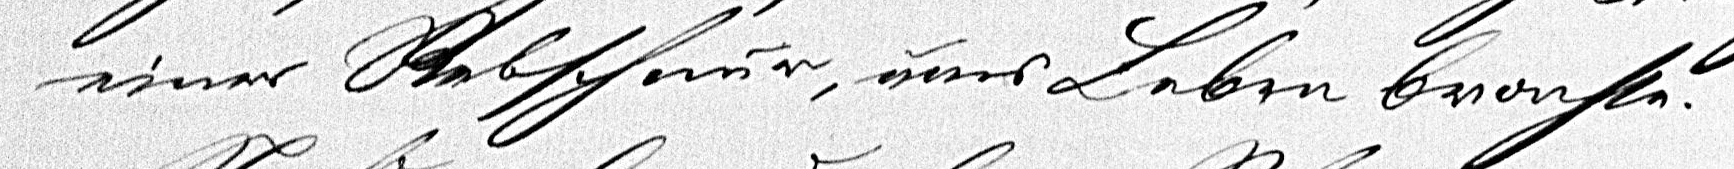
einer Rebschnur, uns Leben brachte.
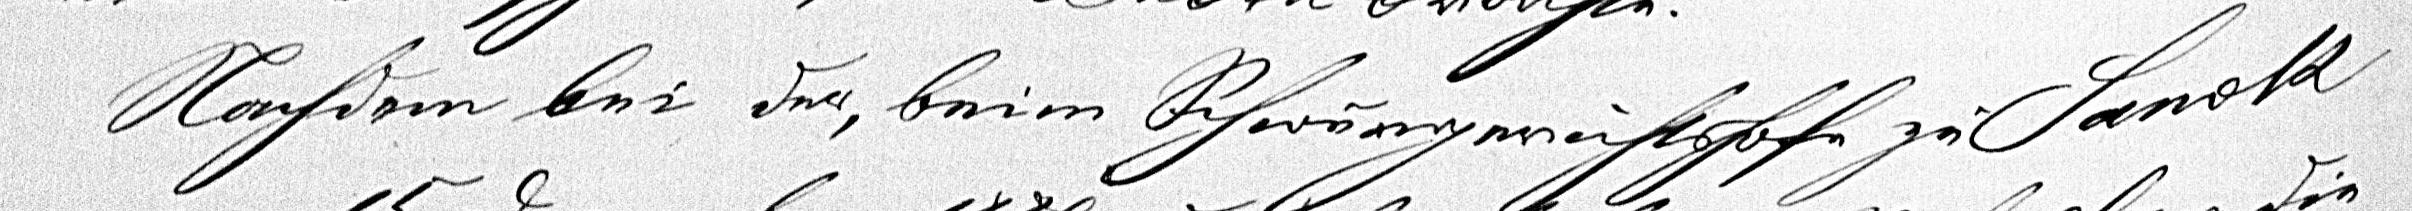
Nachdem bei der, beim Schwörgerichtshofe zu Sanok
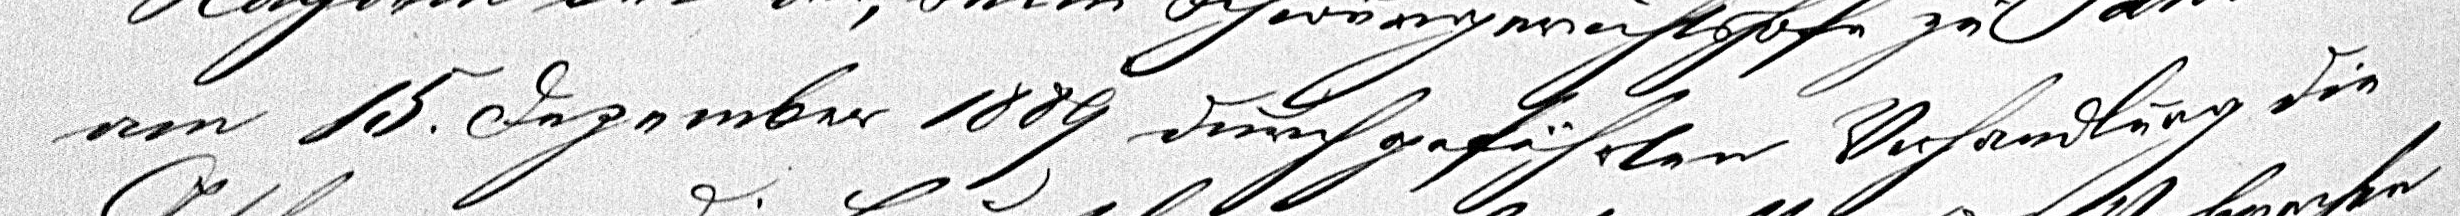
am 15. Dezember 1889 durch geführten Verhandlung die
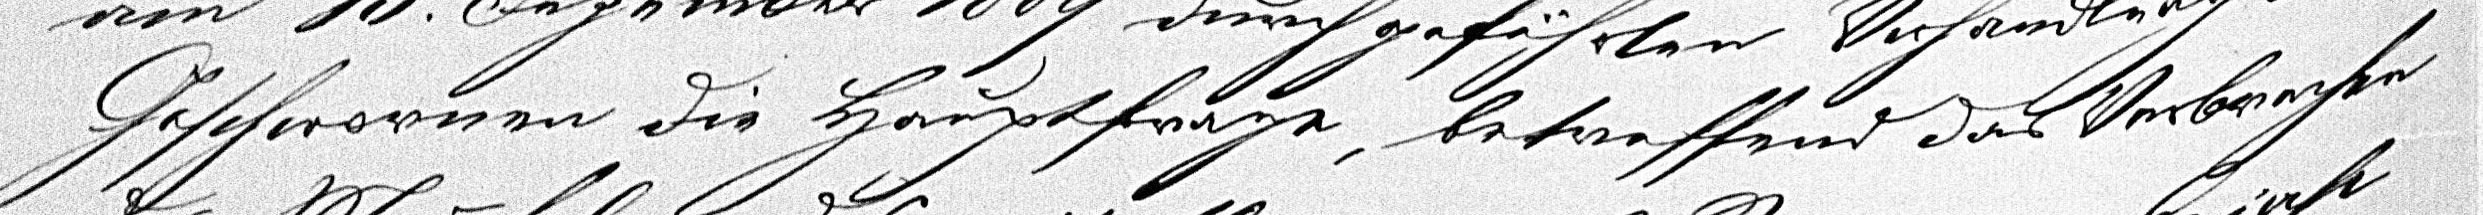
Geschwornen die Hauptfrage, betreffend das Verbrechen
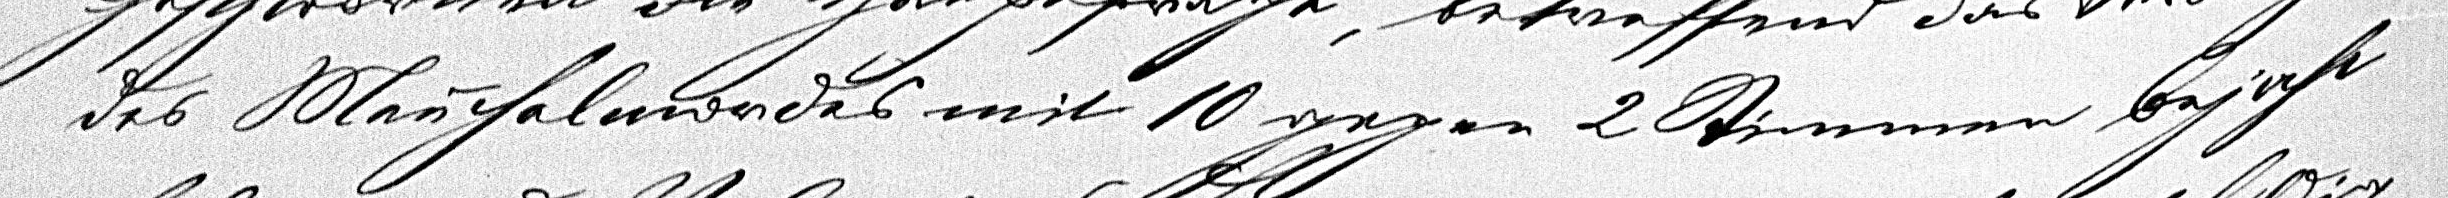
des Meuchelmordes mit 10 gegen 2 Stimmen bejaht
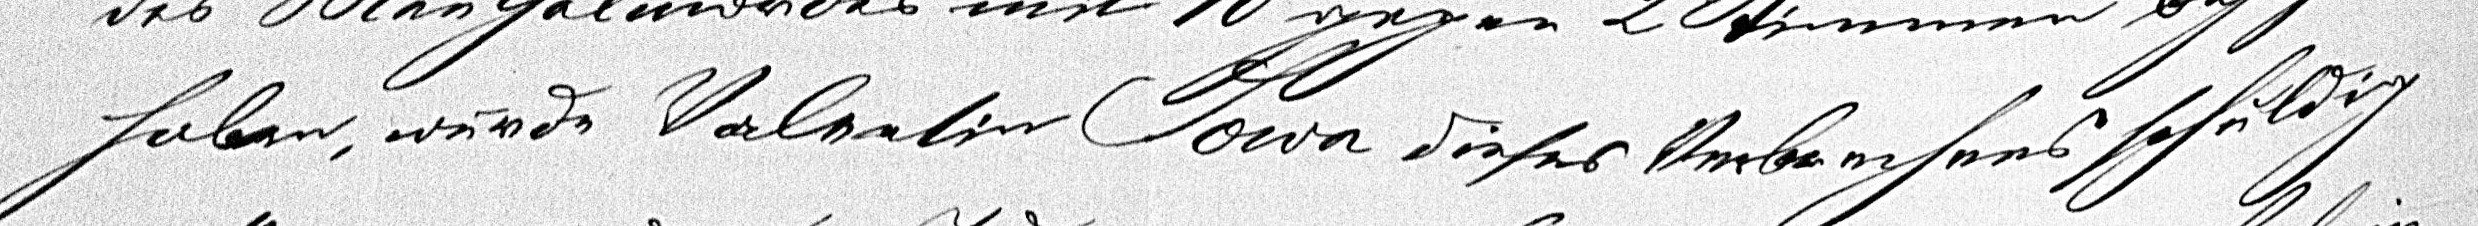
haben, wurde Valentin Sowa dieses Verbrechens schuldig
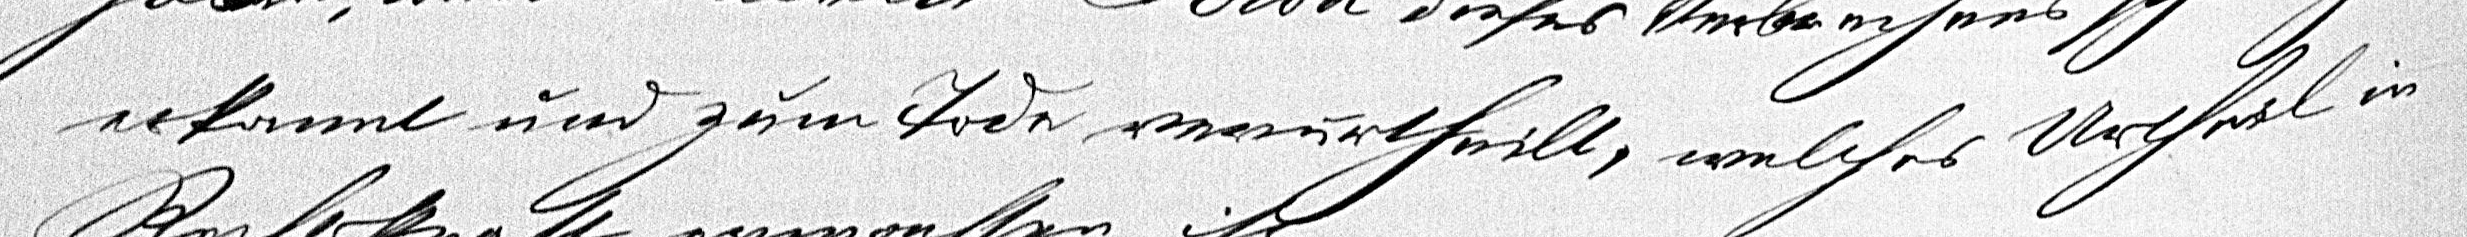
erkannt und zum Tode verurtheilt, welches Urtheil in
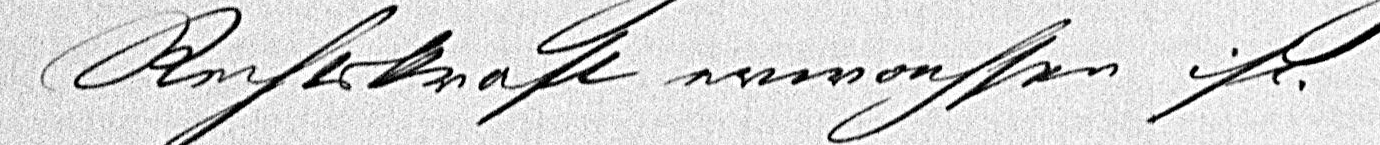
Rechtskraft erwachsen ist.
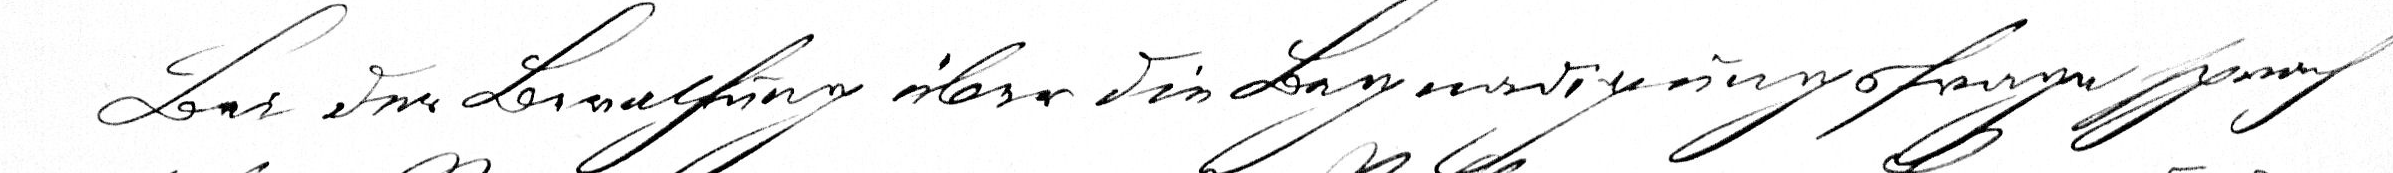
Bei der Berathung über die Begnadigungsfrage sprach
